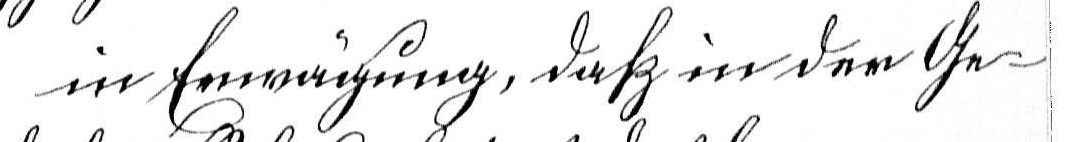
in Erwägung, daß in der Ge¬
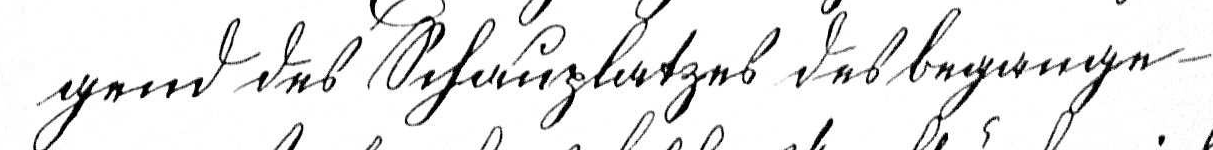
gend des Schauplatzes des begange¬
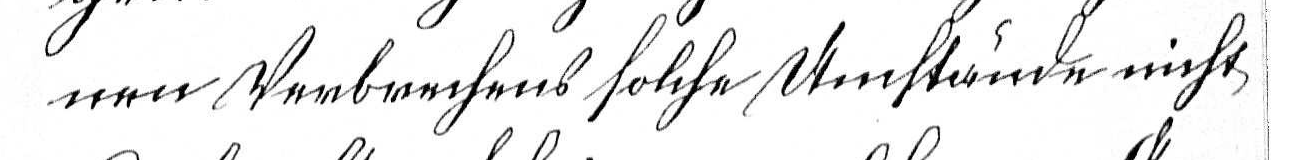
nen Verbrechens solche Umstände nicht
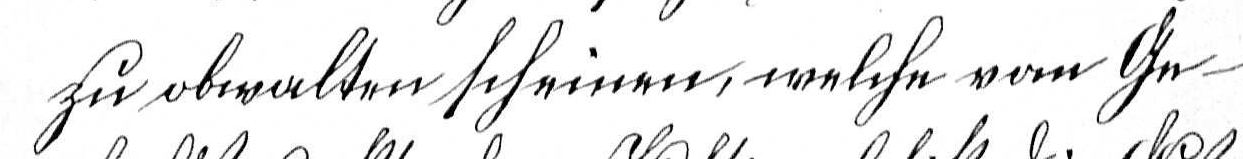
zu obwalten scheinen, welche vom Ge¬
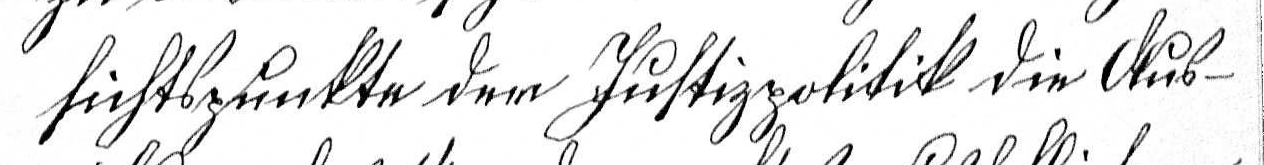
sichtspunkte der Justizpolitik die Aus¬
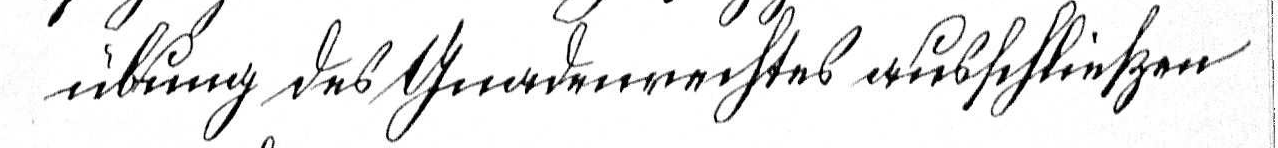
übung des Gnadenrechtes auschließen
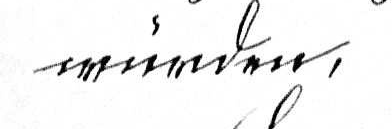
würden,
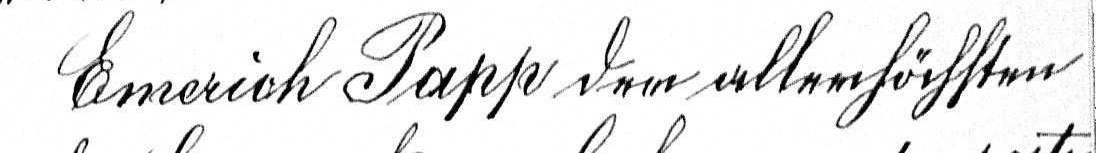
Emerich Papp der allerhöchsten
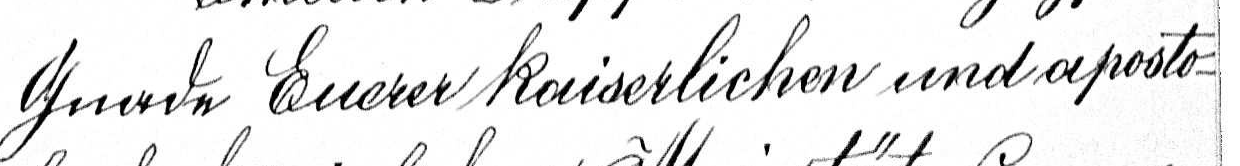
Gnade Euerer kaiserlichen und aposto¬
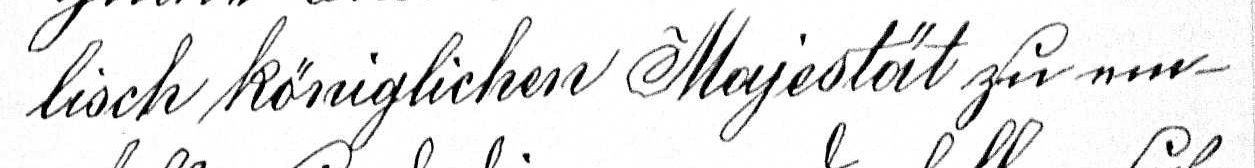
lisch königlichen Majestät zu em¬
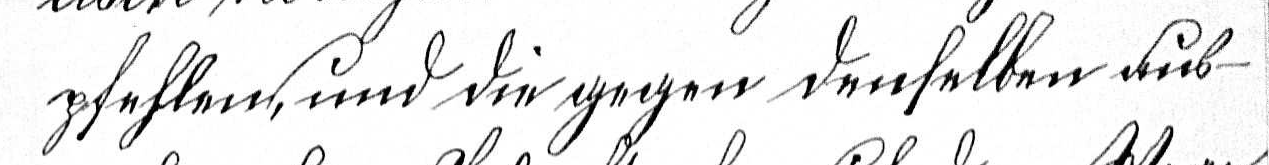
pfehlen, und die gegen denselben aus¬
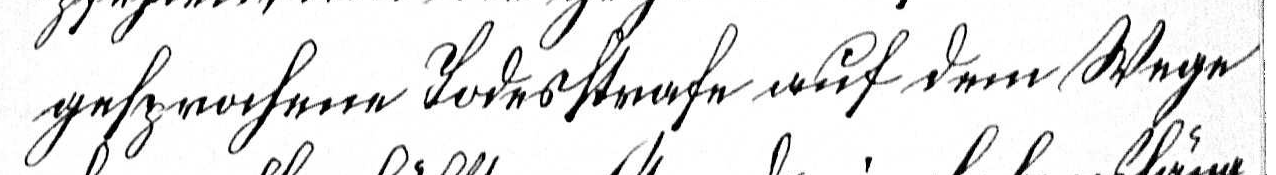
gesprochene Todesstrafe auf dem Wege
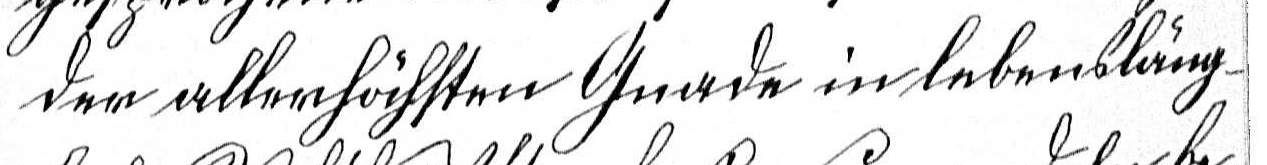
der allerhöchsten Gnade in lebensläng¬
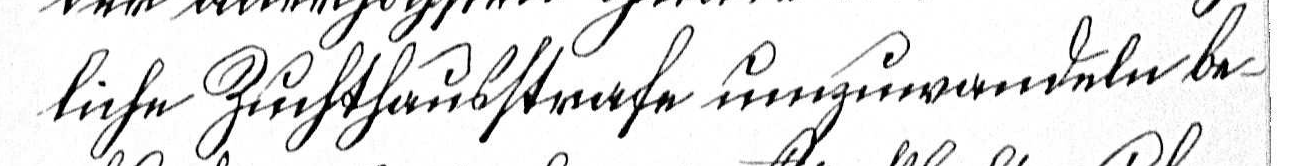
liche Zuchthausstrafe umzuwandeln be¬
